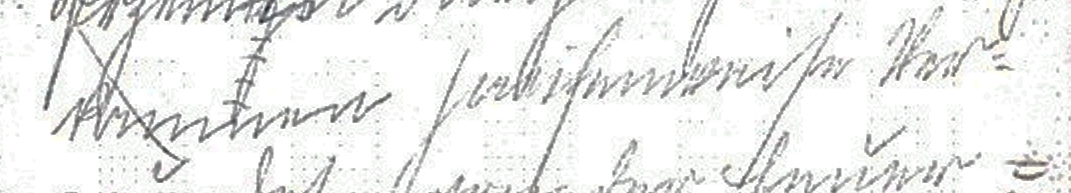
kommen haufenweise Ver-
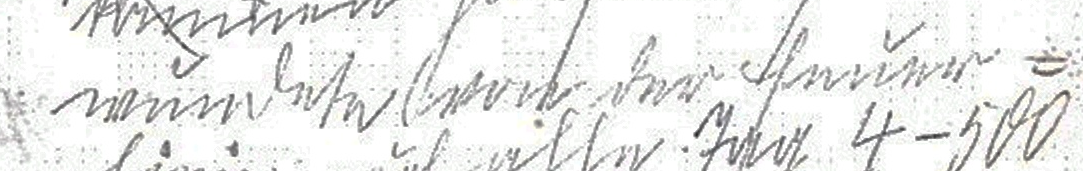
undete von der Feuer-
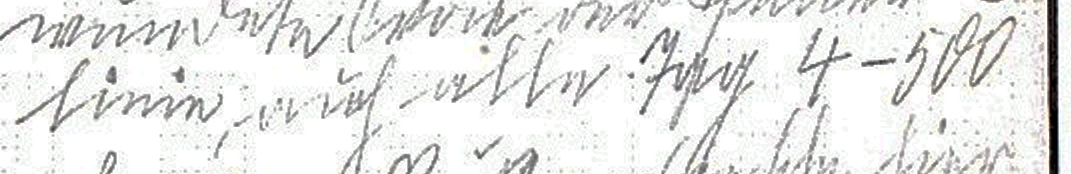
linie, auch alle Tag 4-500
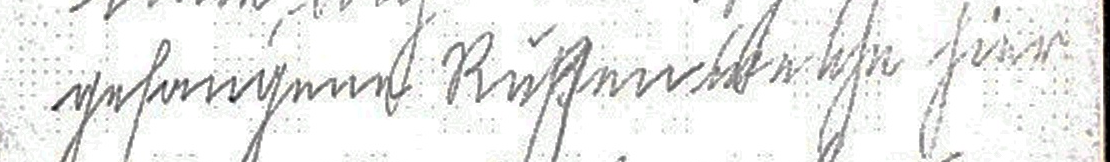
gefangene Russen welche hier
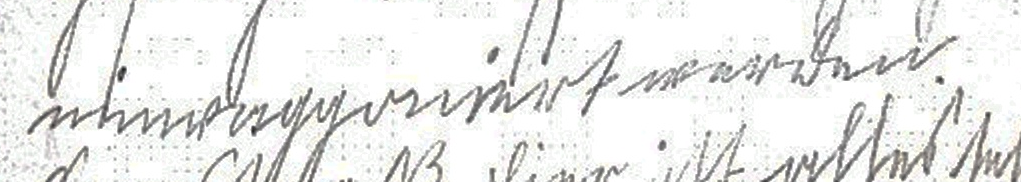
einwaggoniert werden.
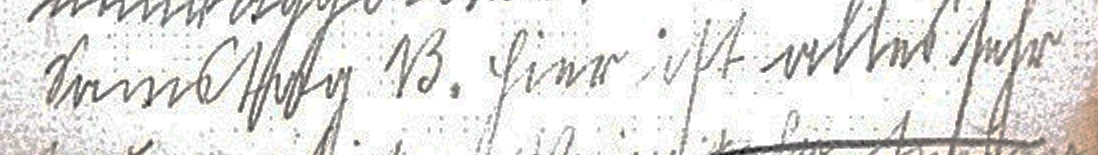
Samstag 13. Hier ist alles sehr
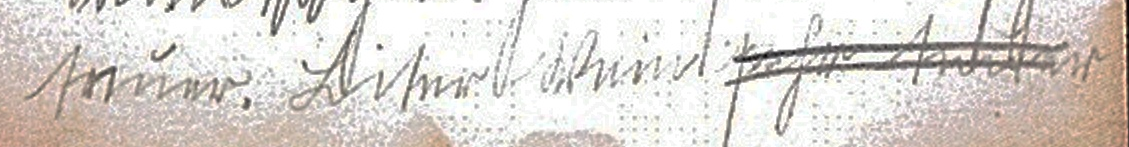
teuer. Liter Wein
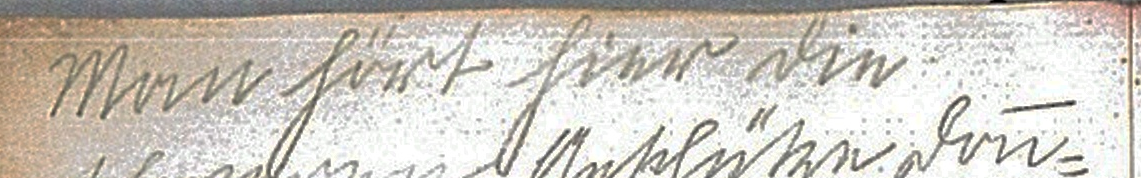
Man hört hier die
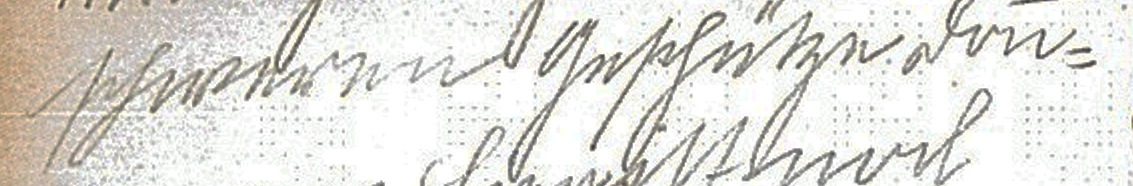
schweren Geschütze don-
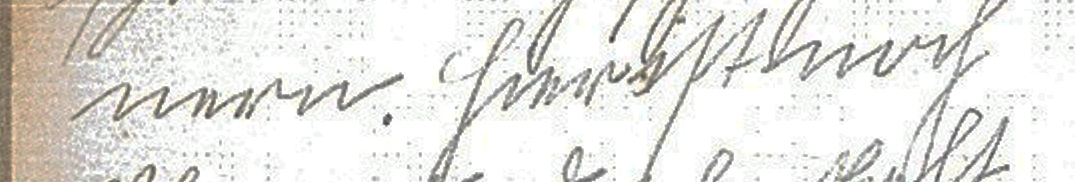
nern. Hier ist noch
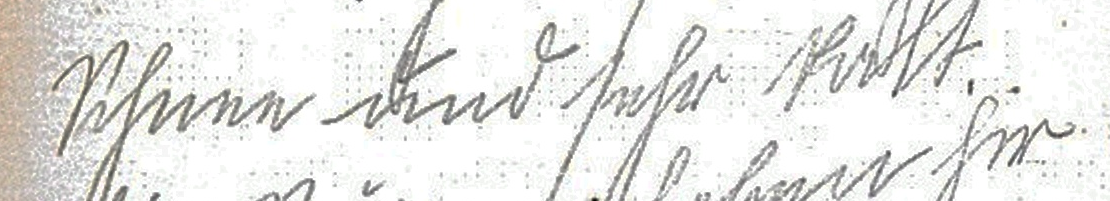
Schnee und sehr kalt.
